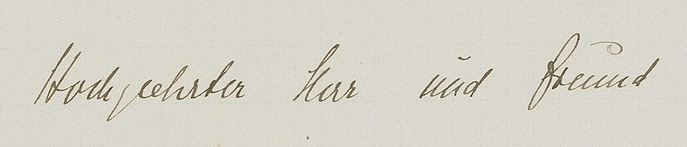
Hochgeehrter Herr und Freund
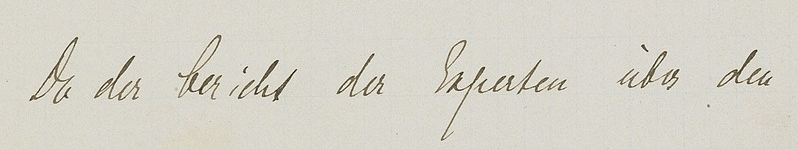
Da der Bericht der Experten über den
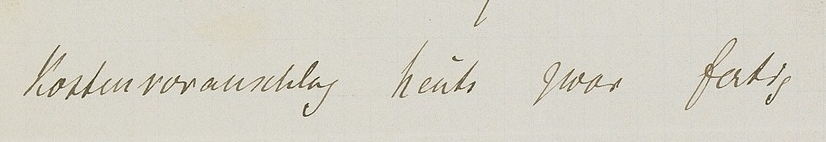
Kostenvoranschlag heute zwar fertig
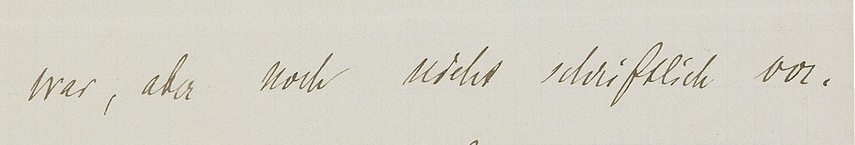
war, aber noch nicht schriftlich vor-
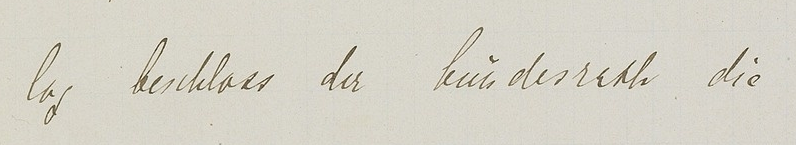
lag beschloss der Bundesrath die
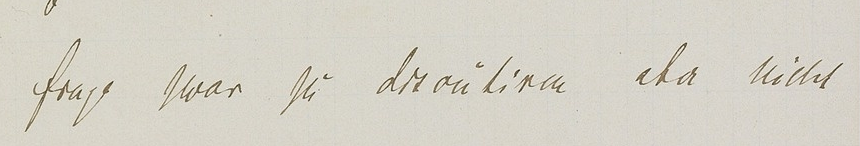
Frage zwar zu discutiren aber nicht
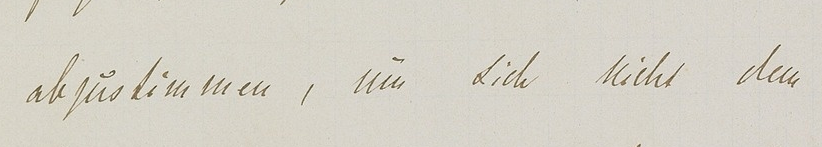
abzustimmen, um sich nicht dem
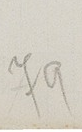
die
